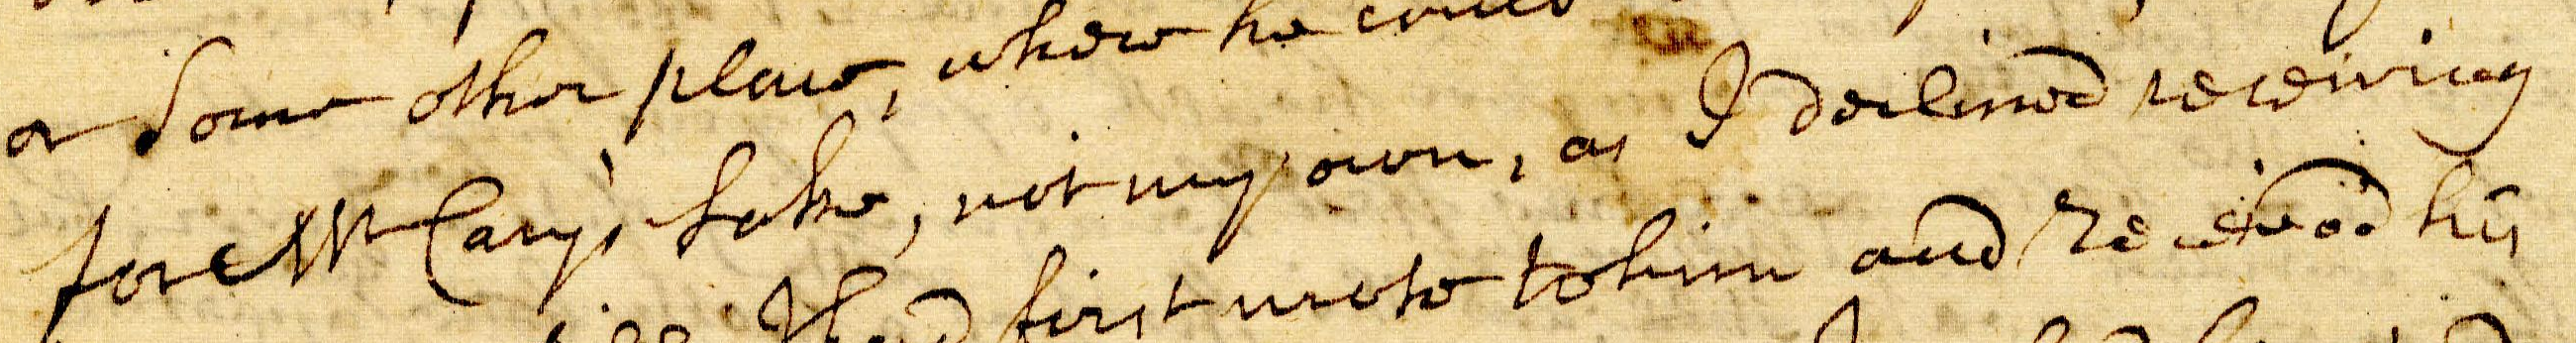for M^ Cary's sake, not my own, as I deliverd so diving
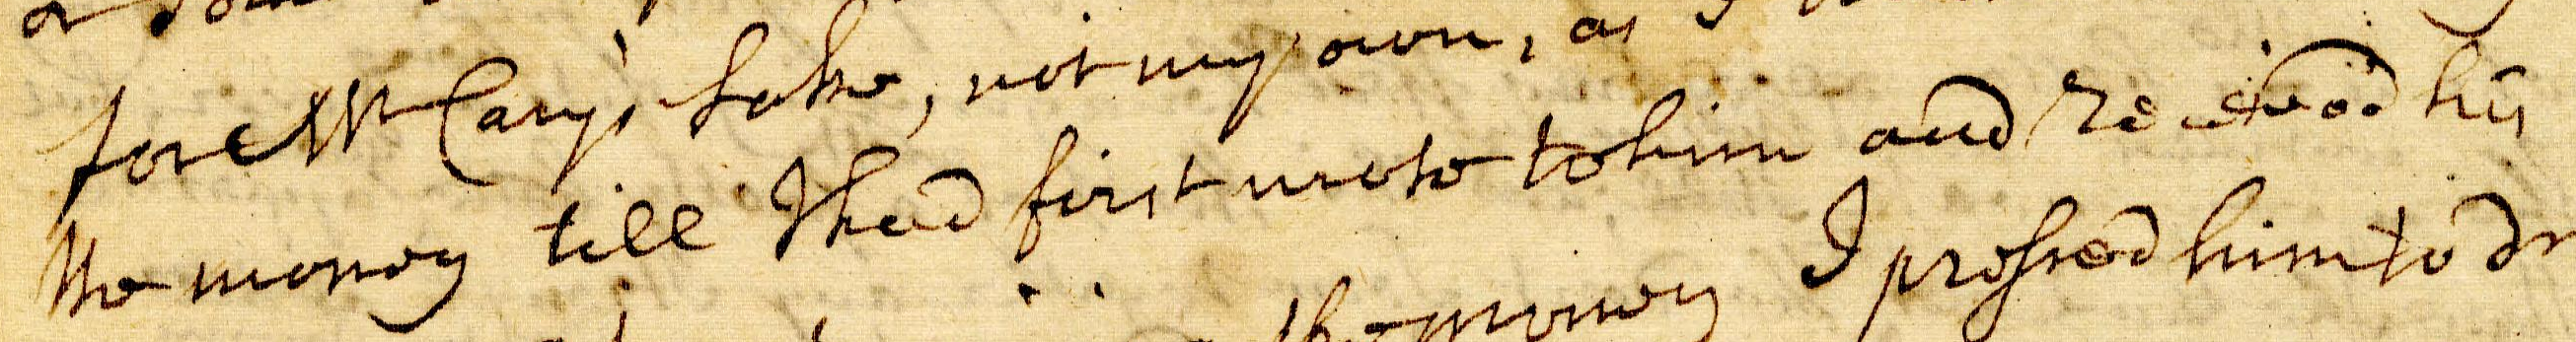the money till I had first wrote to him and received his
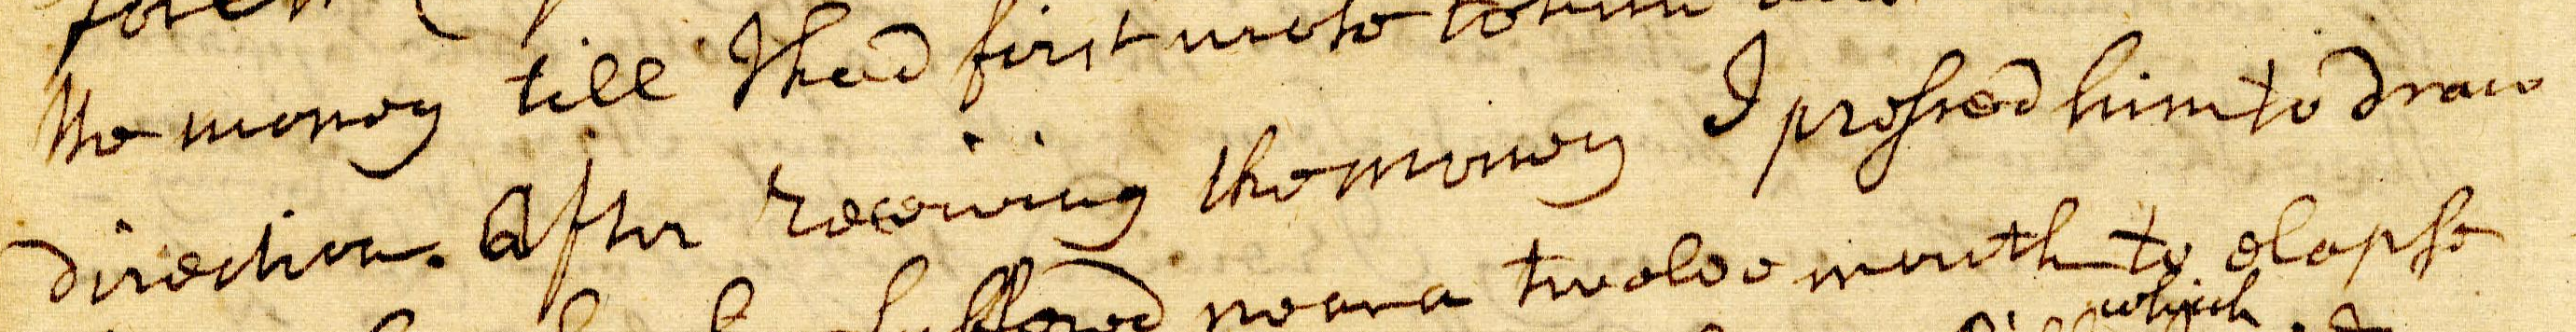direction. After receiving the money I pressed him to draw
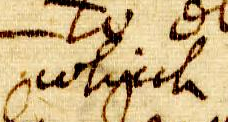which
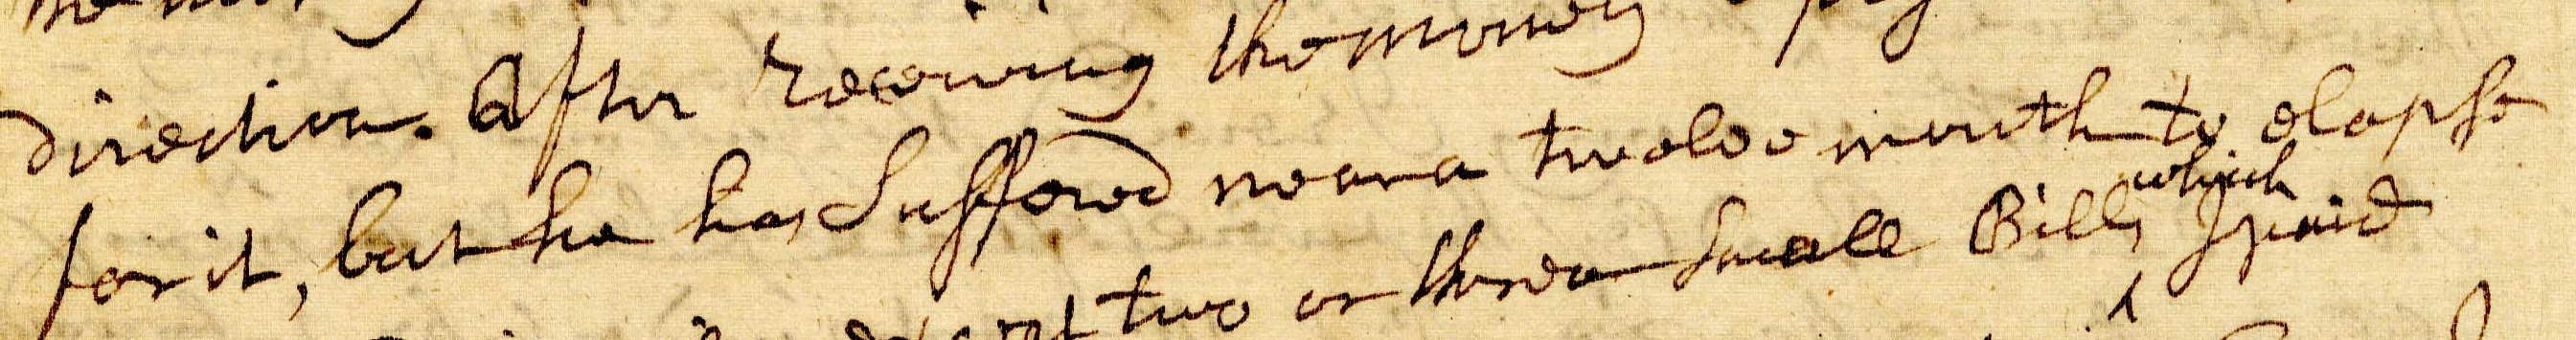for it, but he has Suffored near a twelve month to f elapse
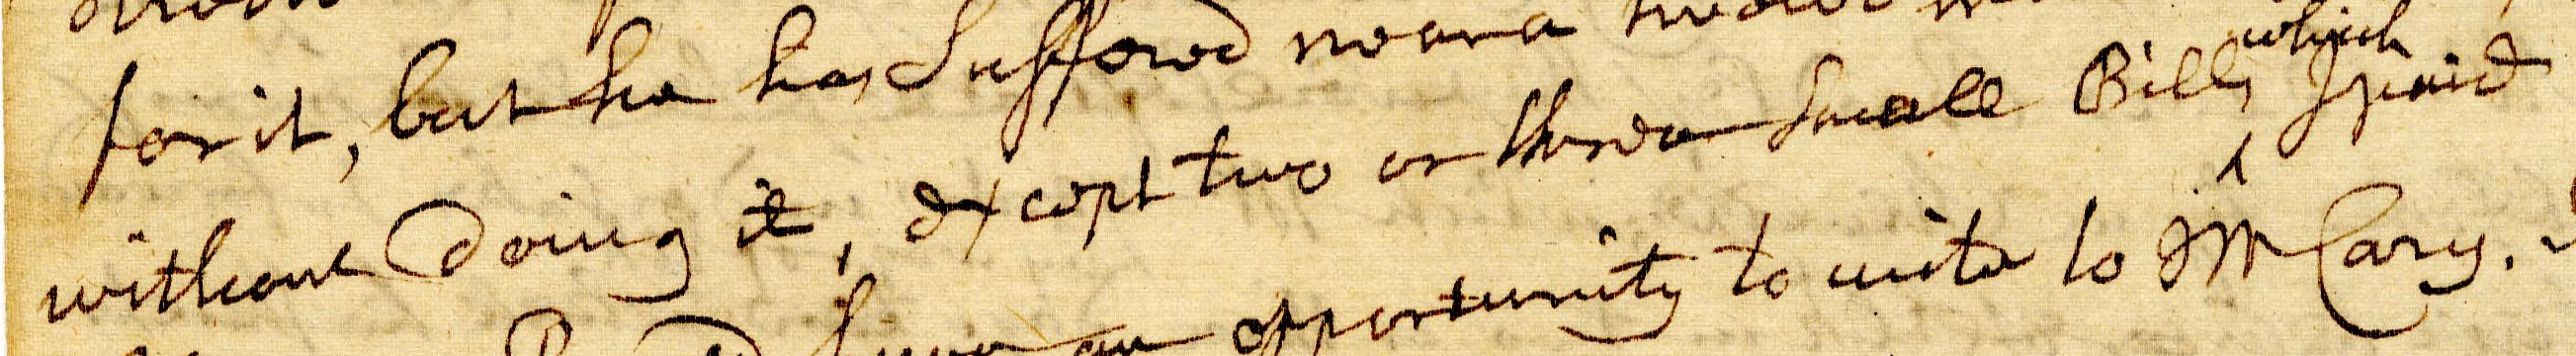withot doing it, except twe or three small bills ^ I paid
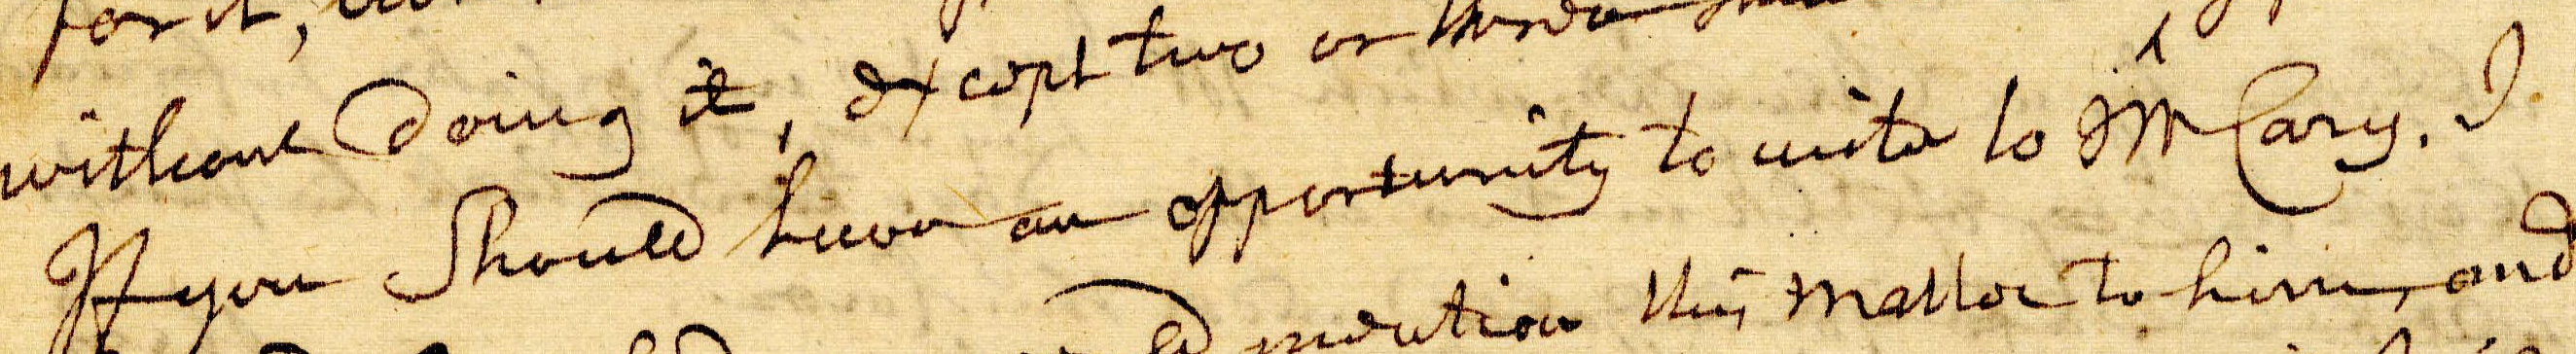If you should have an oppertunuity to write to M Cary. I
